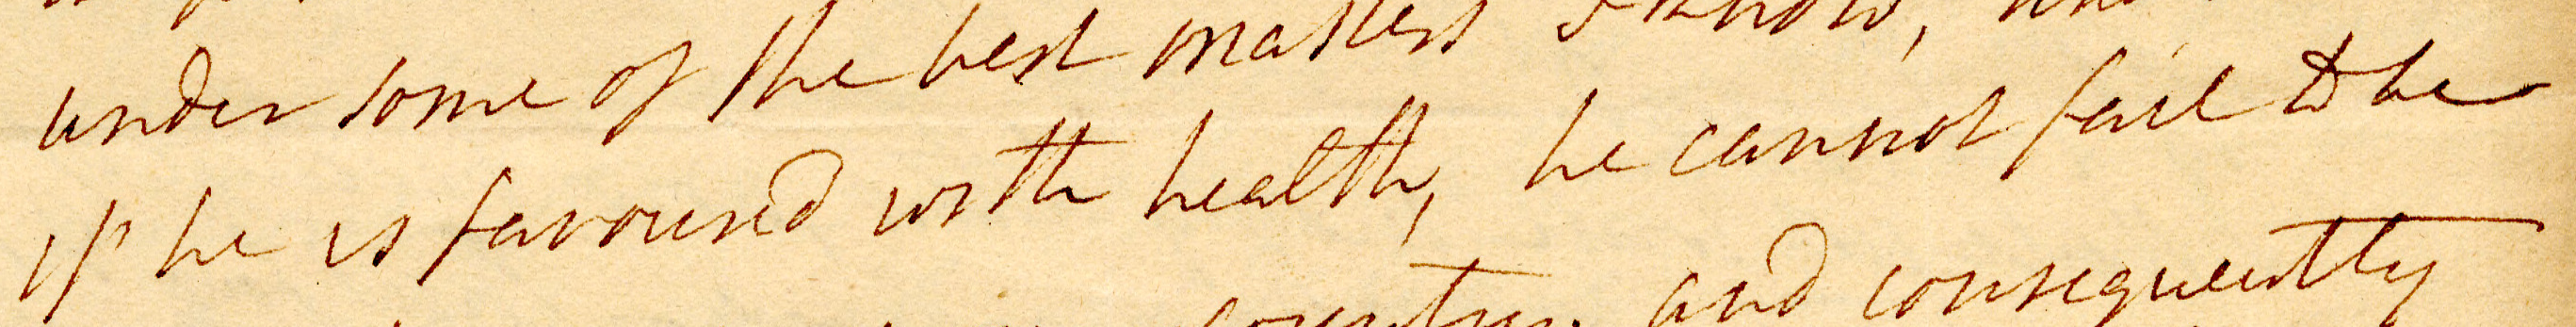if he is favoured with health, he cannot fail to be
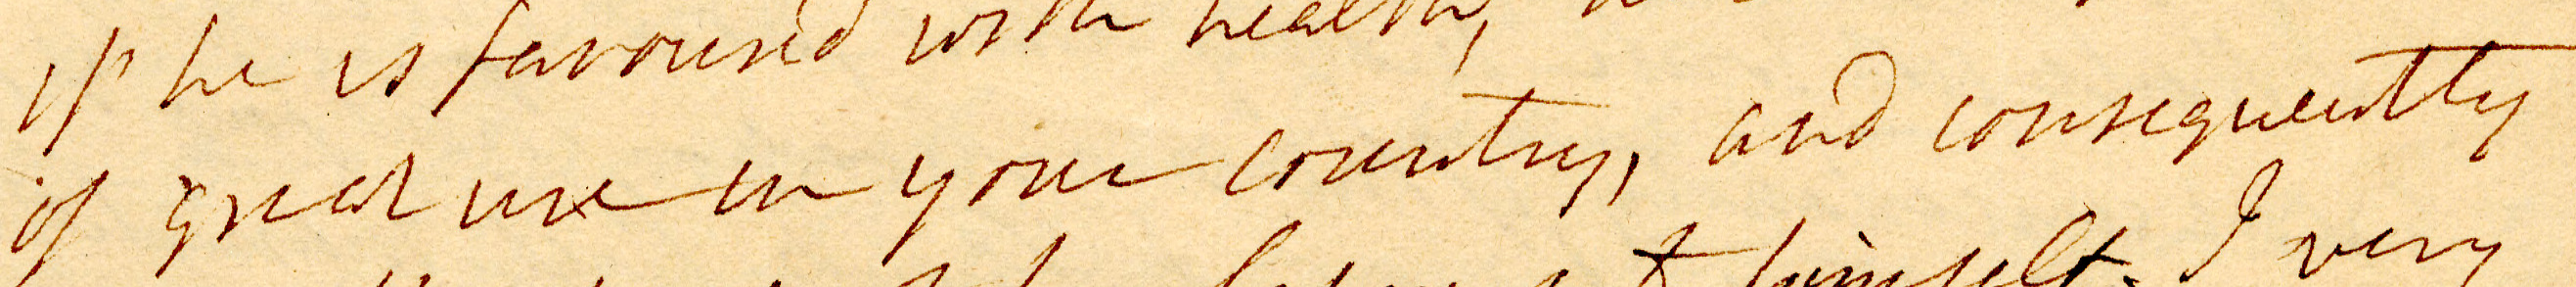of great use in your country, and consequently
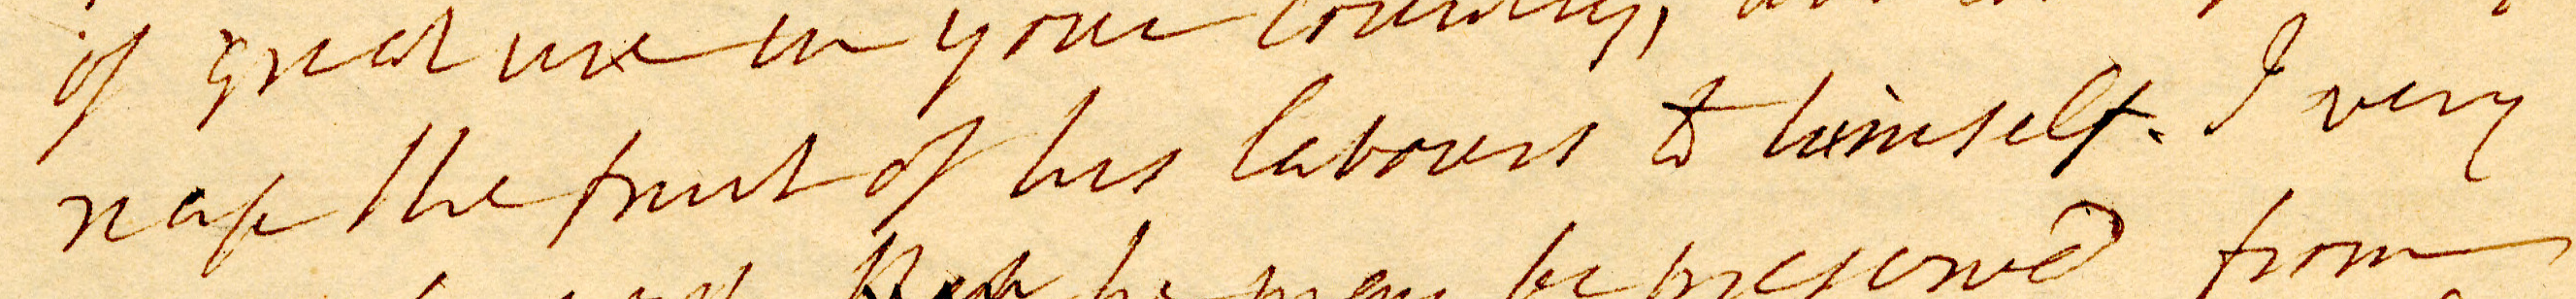reap the fruit of his labours to himself. I very
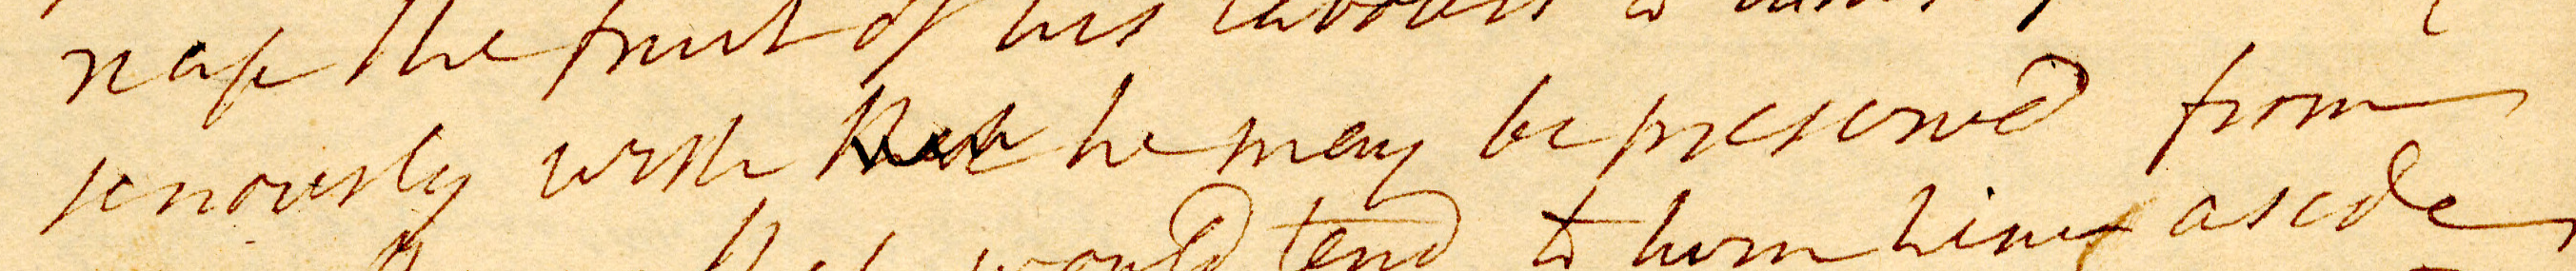seriously wish he may be preserved from
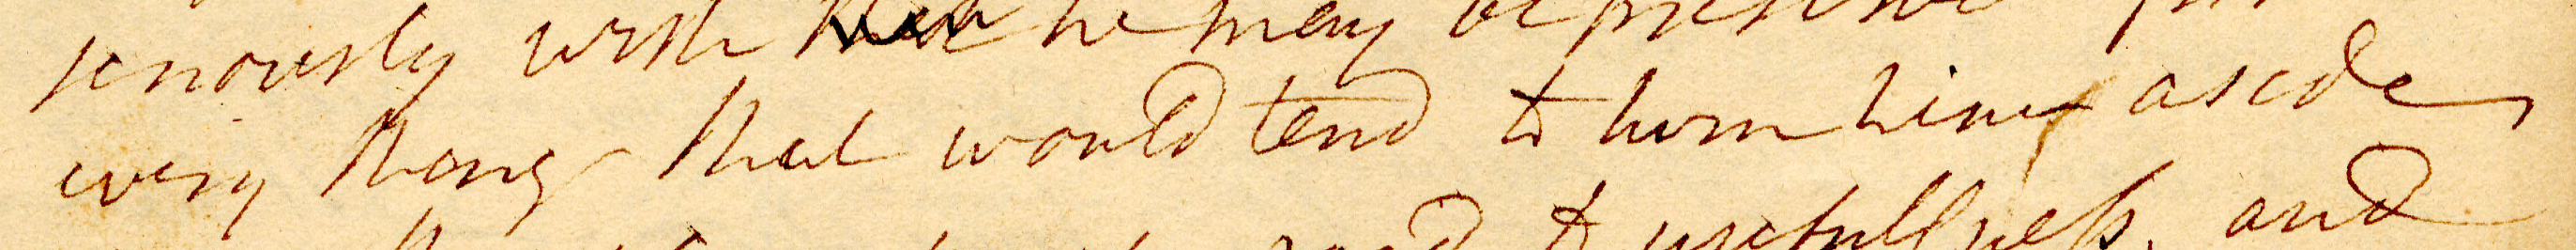every thing that would tend to turn him aside
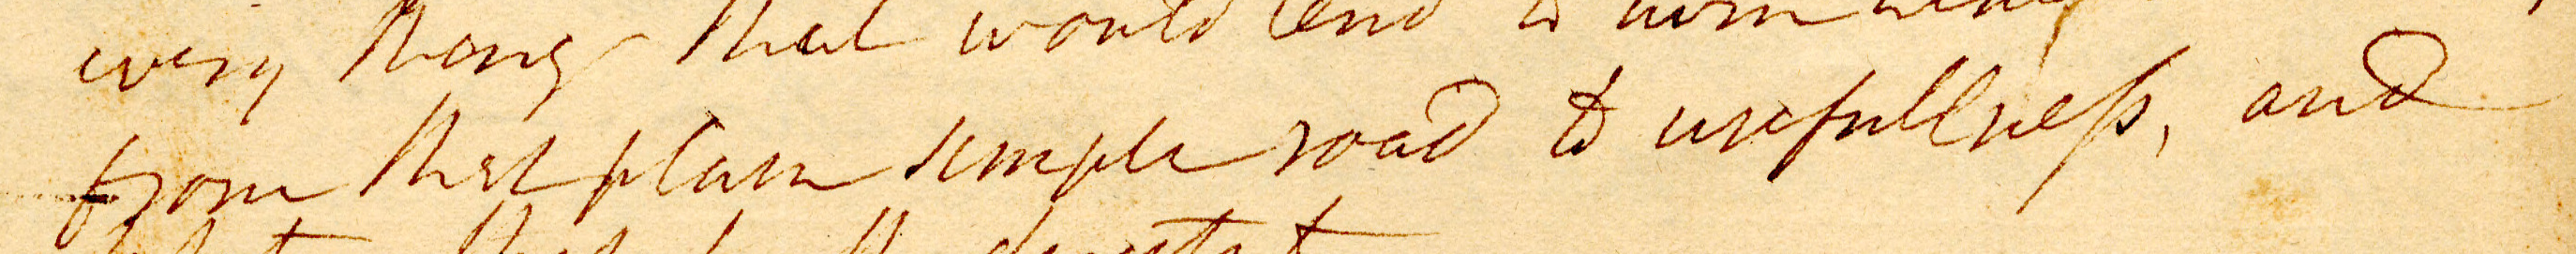from that plain simple road to usefulness, and
